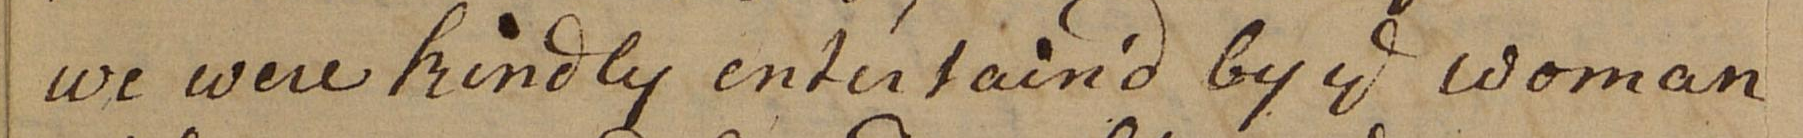we were kindly entertain'd by y^e woman
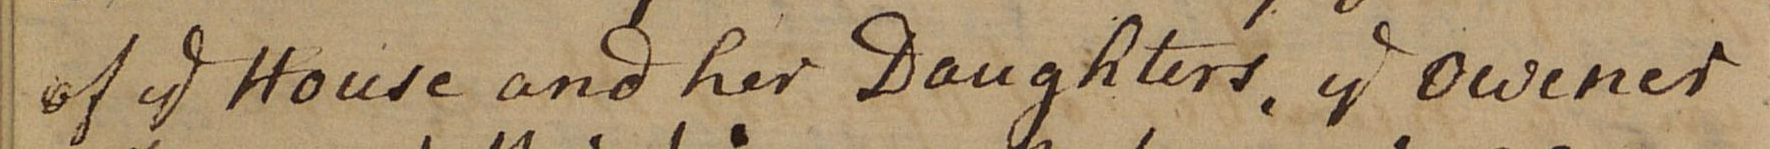of y^e House and her Daughters, y^e owener
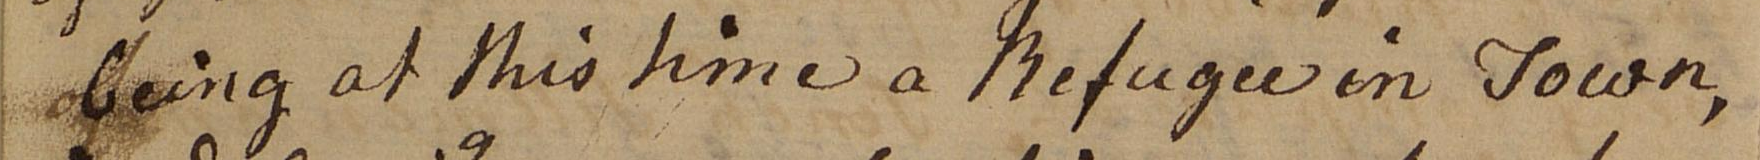being at this time a Refugee in Town,
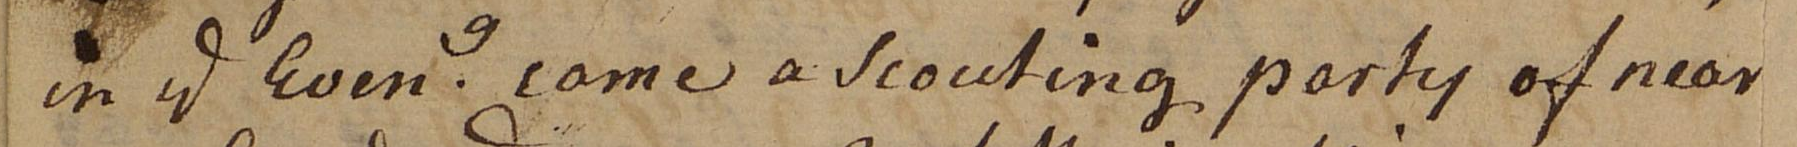in y^e Even^g. came a Scouting party of near
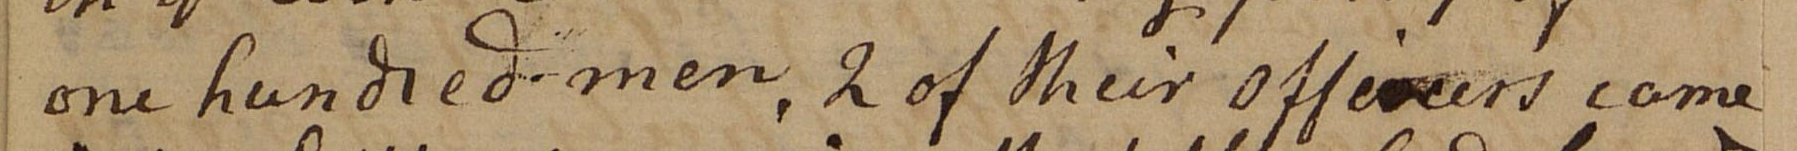one hundred men, 2 of their officers came
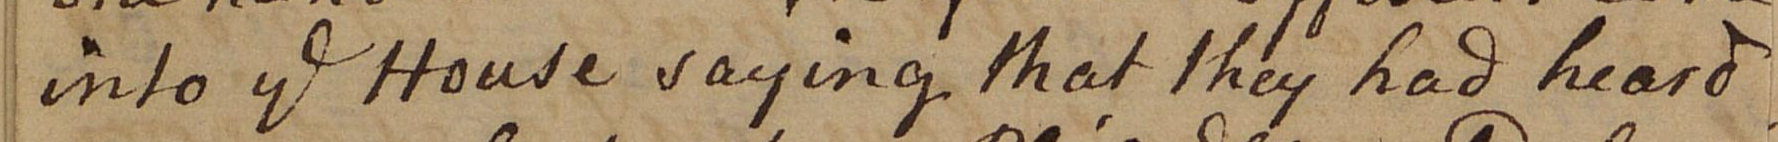into y^e House saying that they had heard
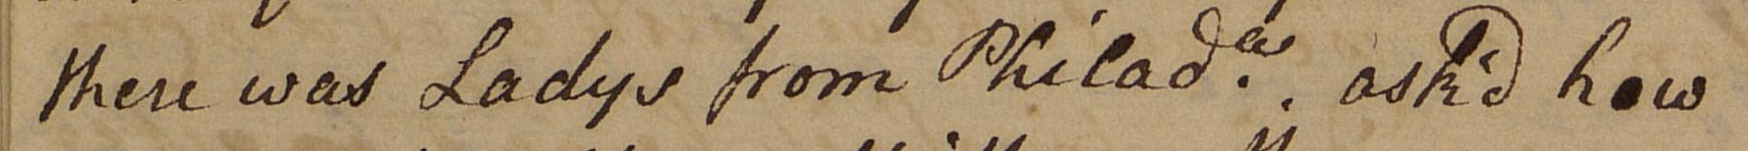there was Ladys from Philad^a., ask'd how
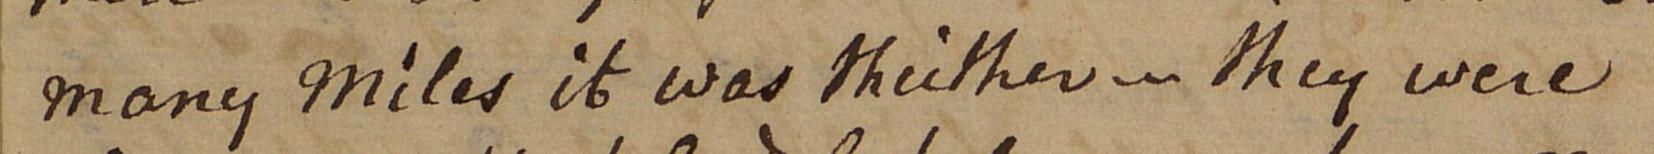many Miles it was theither- they were
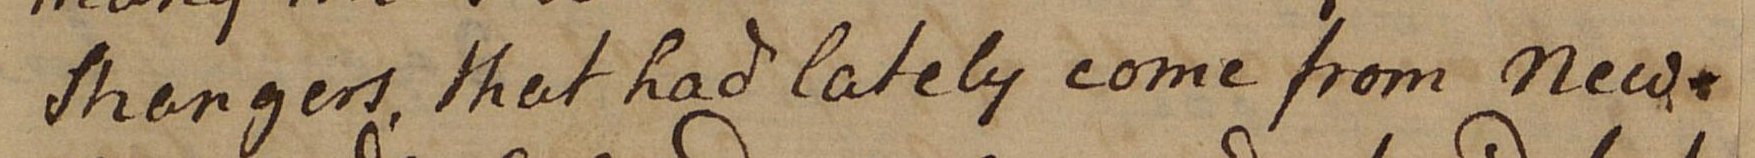Strangers, that had lately come from New-
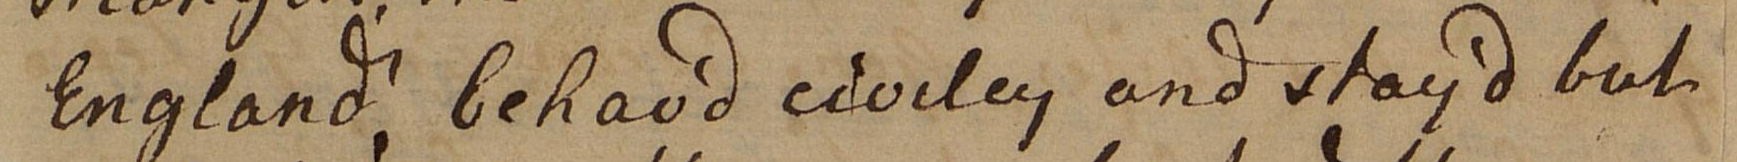England behav'd civiley and stay'd but
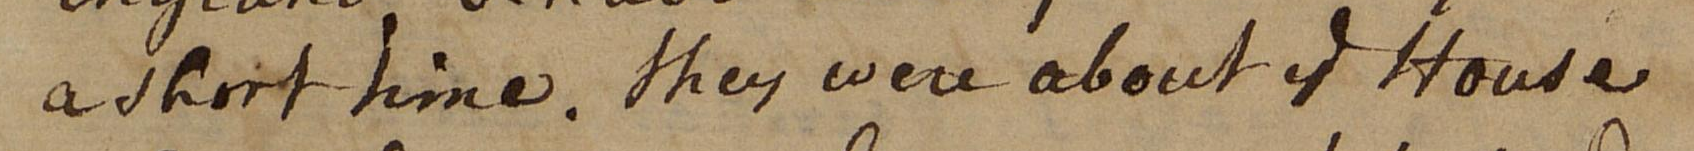a short time. they were about y^e House
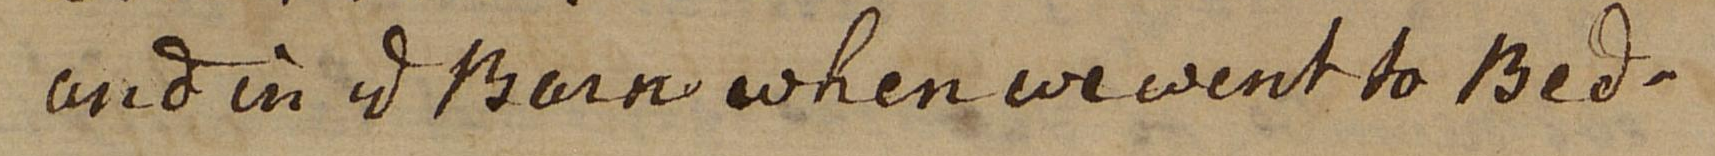and in y^e Barn when we went to Bed-
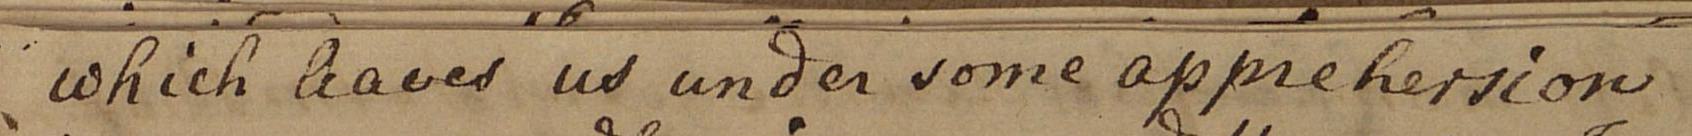which leaves us under some apprehersion
